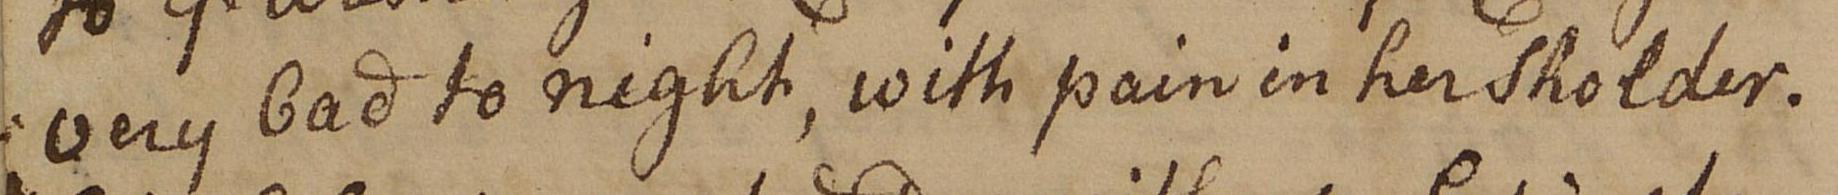very bad to night, with pain in her sholder.
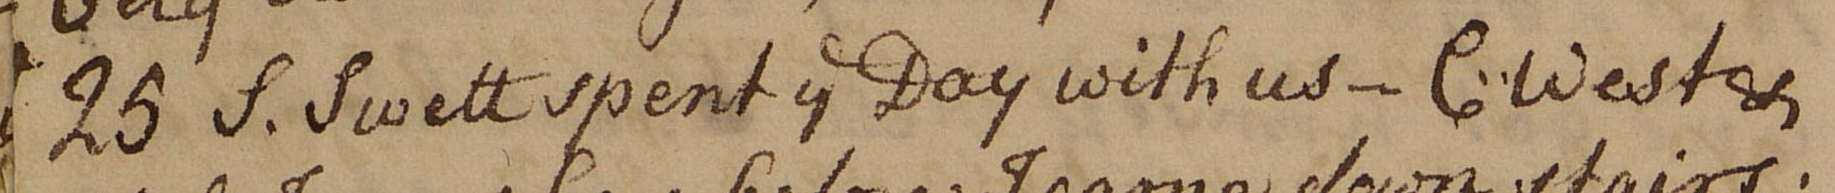25 S. Swett spent y^e Day with us- C West &
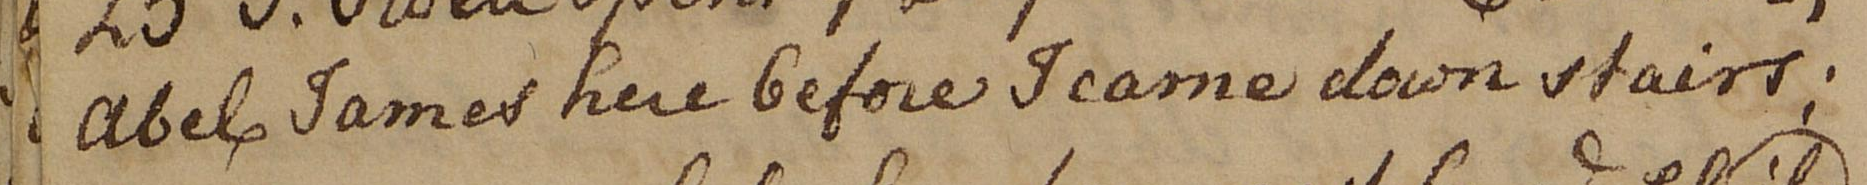Abel James here before I came down stairs;
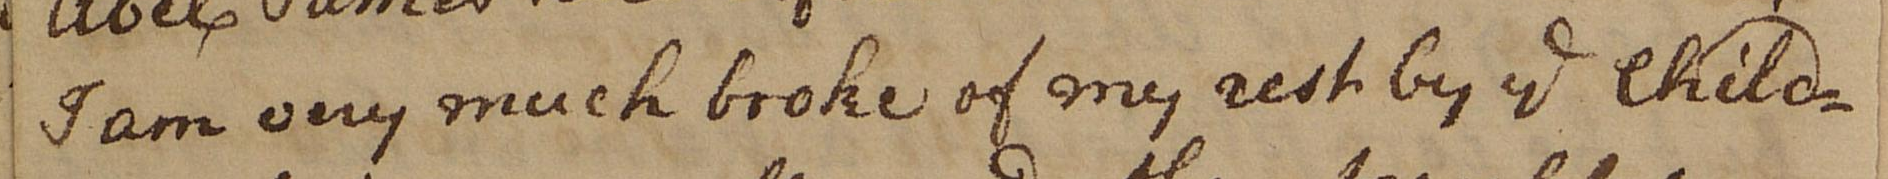I am very much broke of my rest by y^e child-
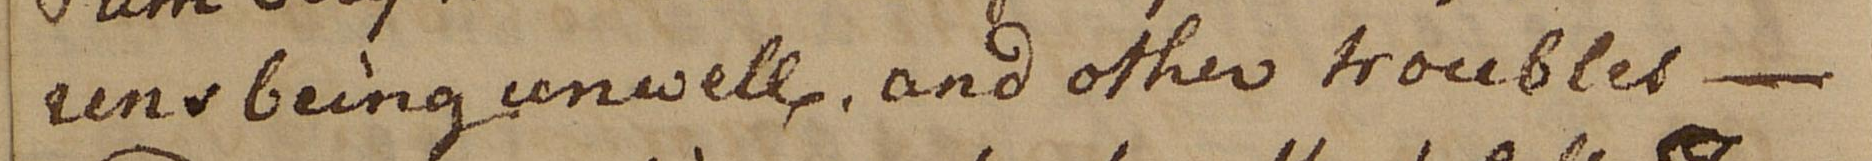rens being unwell, and other troubles-
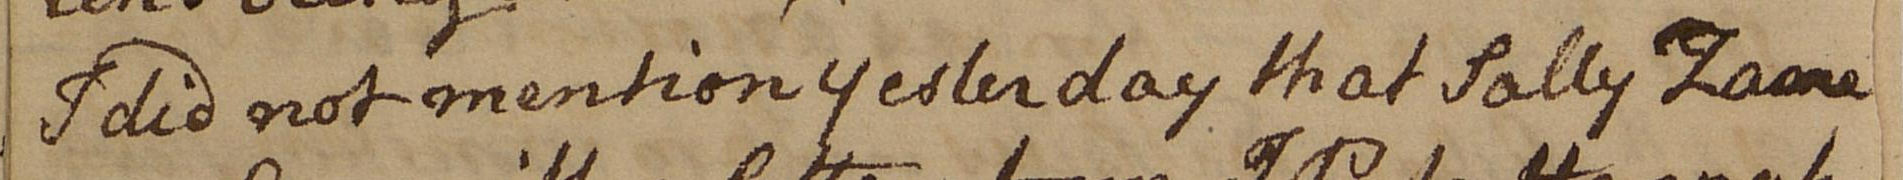I did not mention yesterday that Sally Zane
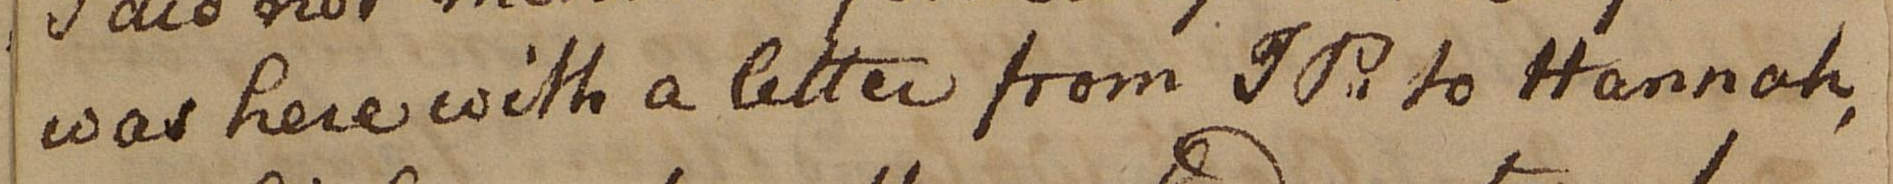was here with a letter from JP. to Hannah,
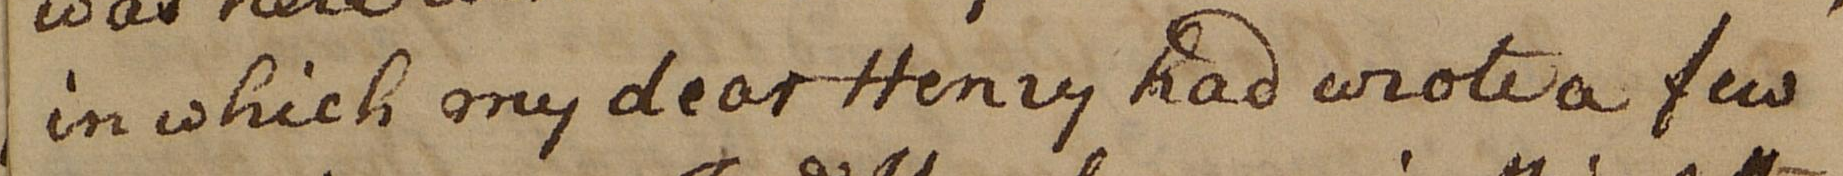in which my dear Henry had wrote a few
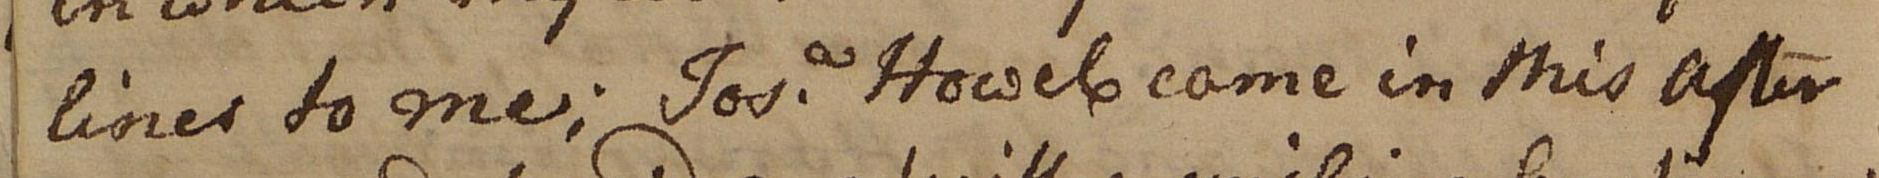lines to me; Jos^a. Howels came in this after
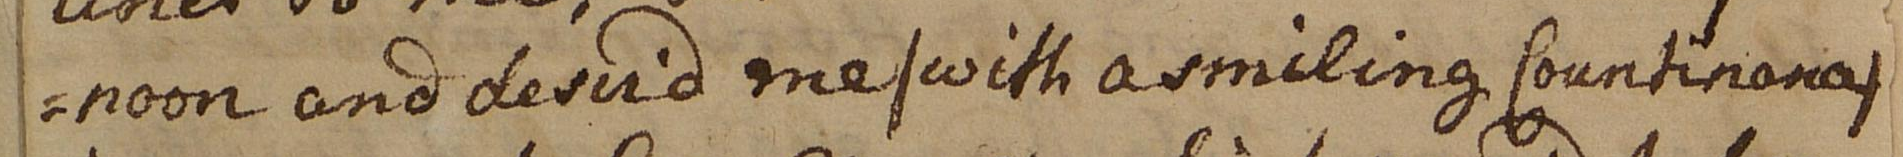-noon and desir'd me /with a smiling Countinance/
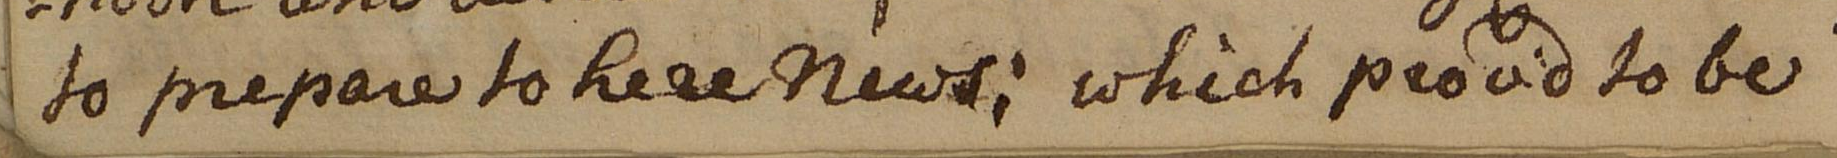to prepare to here news; which proud to be
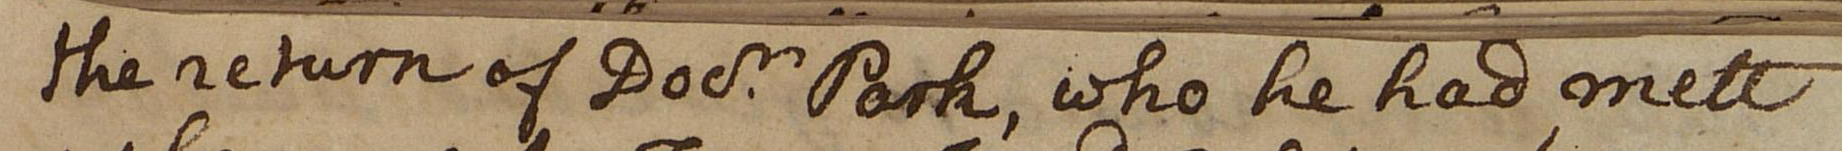the return of Doc^r. Park, who he had mett
